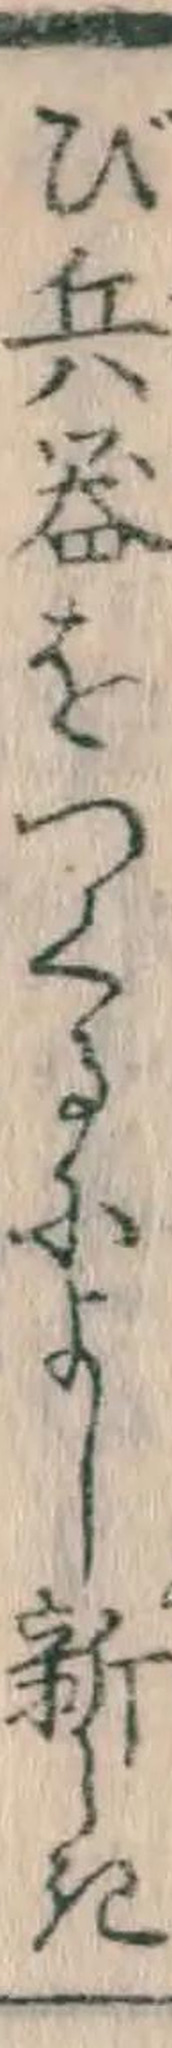び兵器をつくるによし新しき
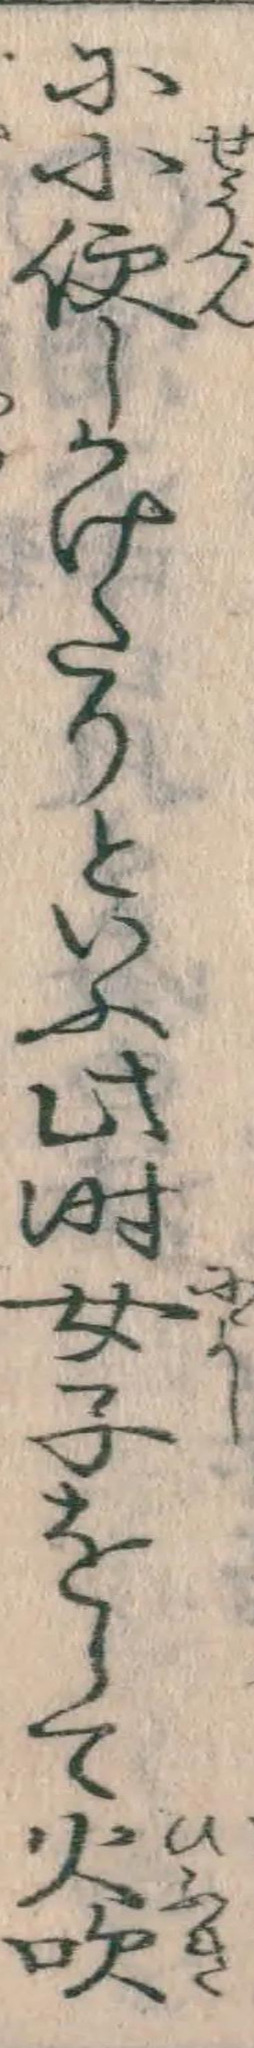に小便しかけたりといふ此時女子をして火吹
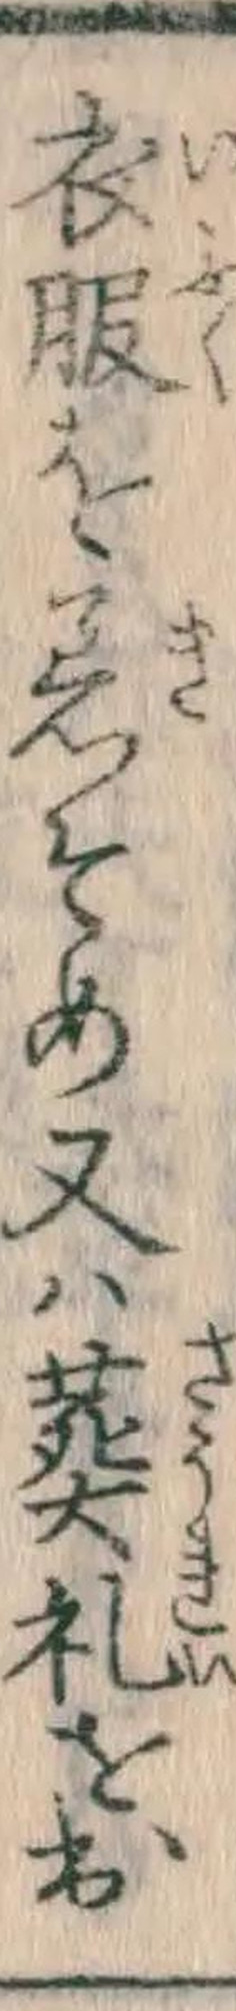衣服を着そめ又は葬礼を出
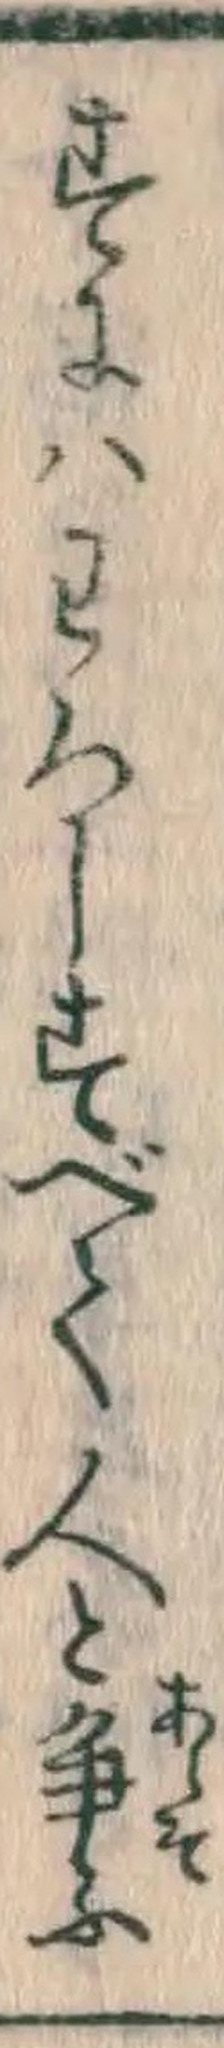すにはわろしすべて人と争ふ
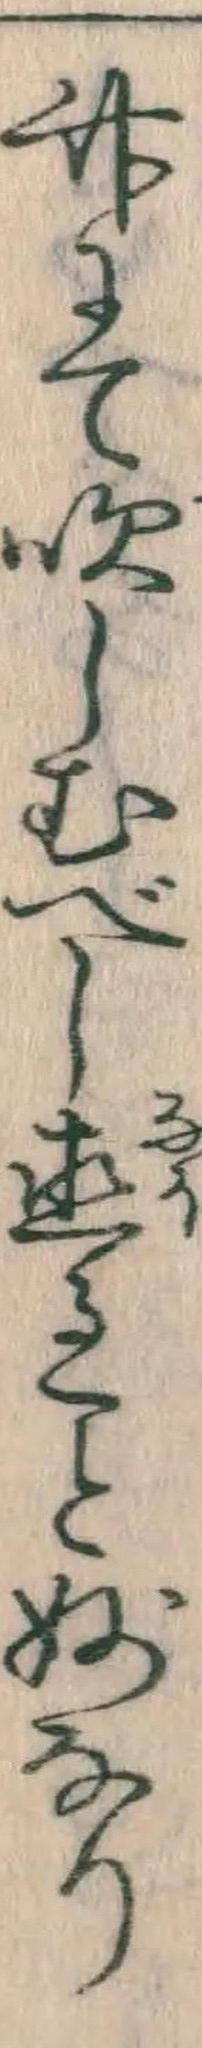竹にて吹しむべし直ること妙なり
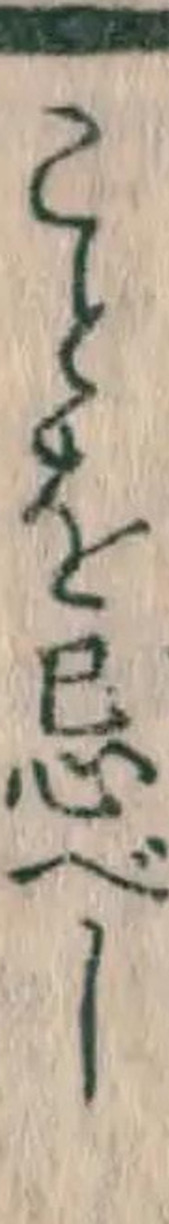ことを忌べし
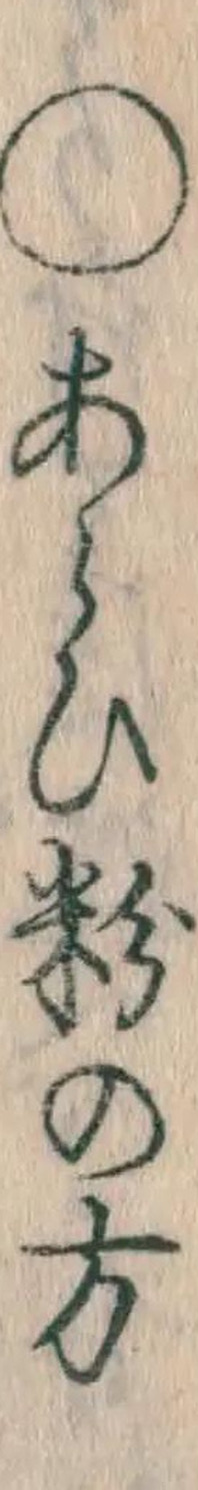○あらひ粉の方
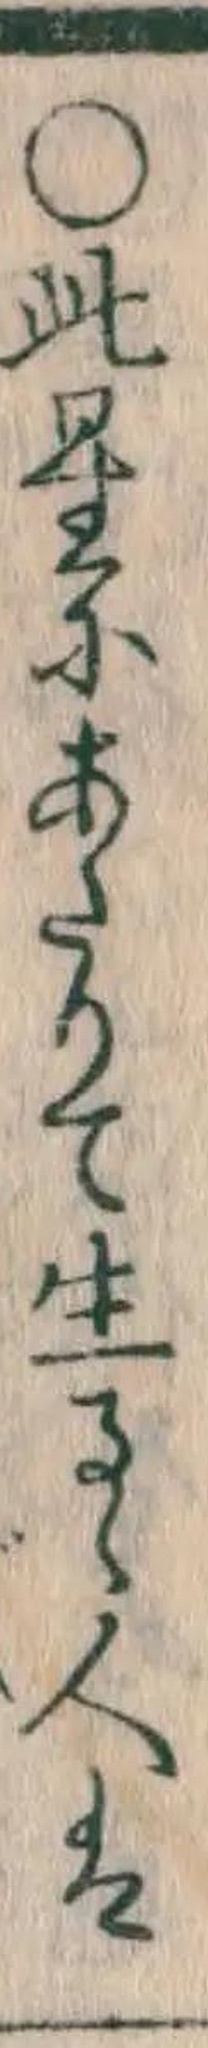○此星にあたりて生るゝ人は
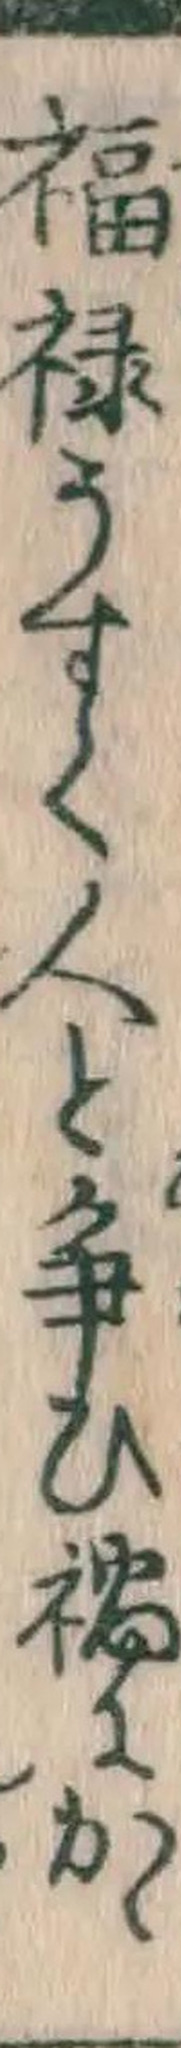福禄うすく人と争ひ禍にかゝ
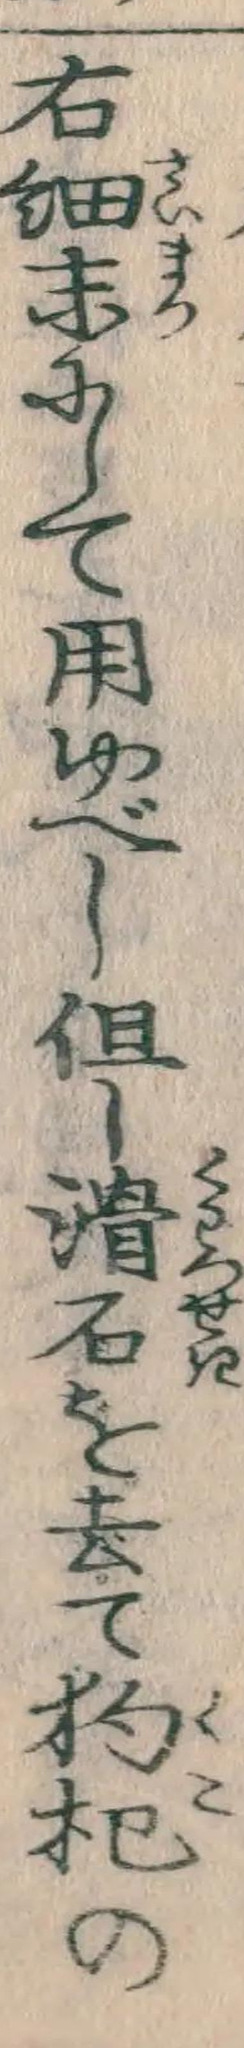右細末にして用ゆべし但し滑石を去て枸杞の
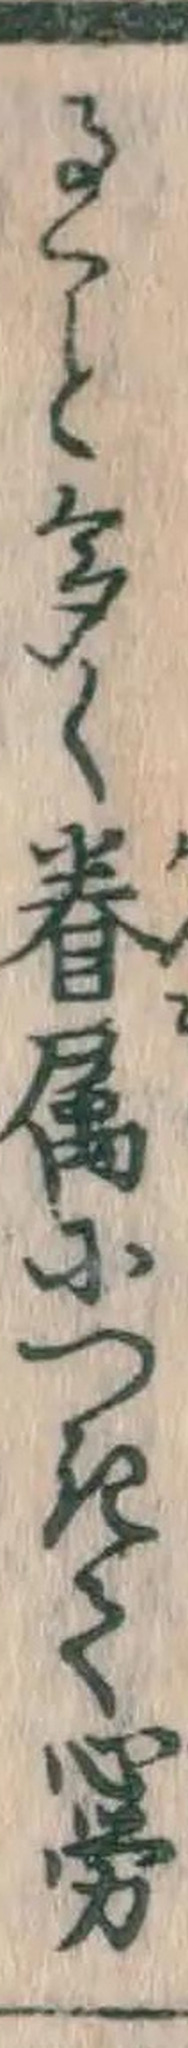ること多く眷属につきて心労
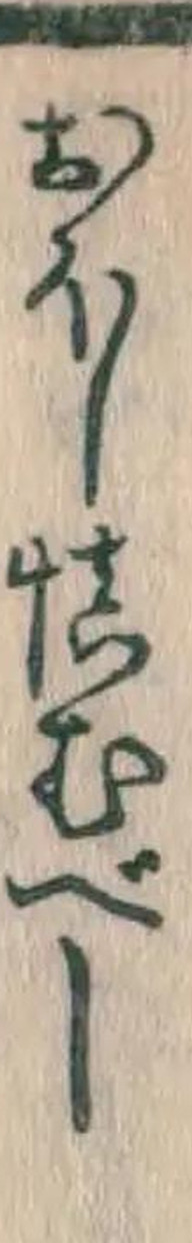おほし慎むべし
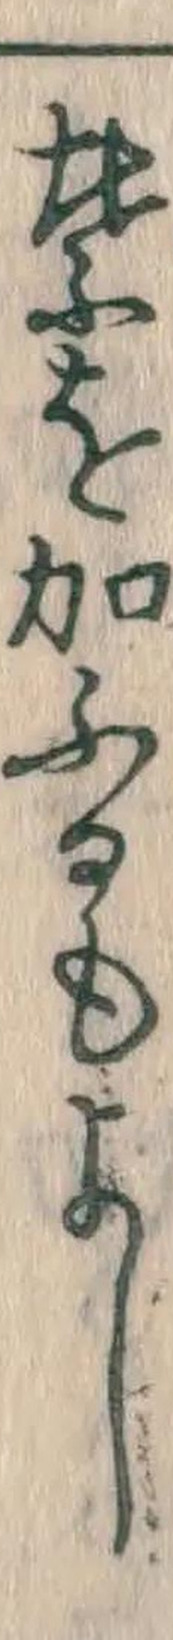葉を加ふるもよし
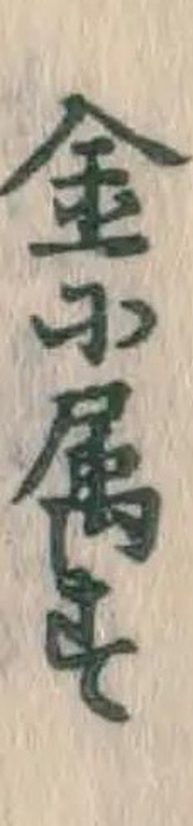虚金に属す
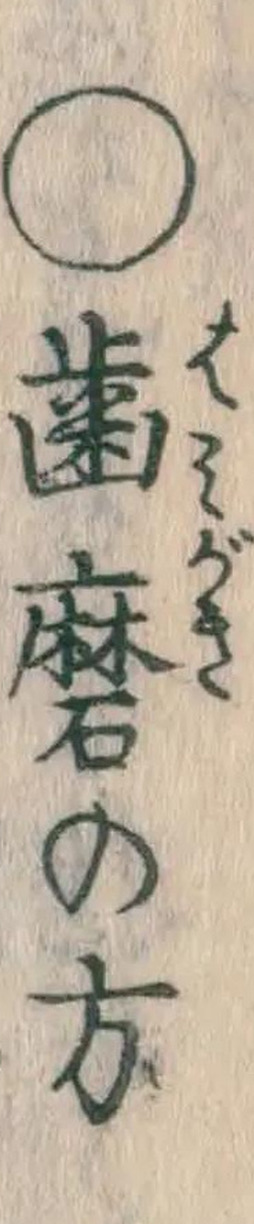○歯磨の方
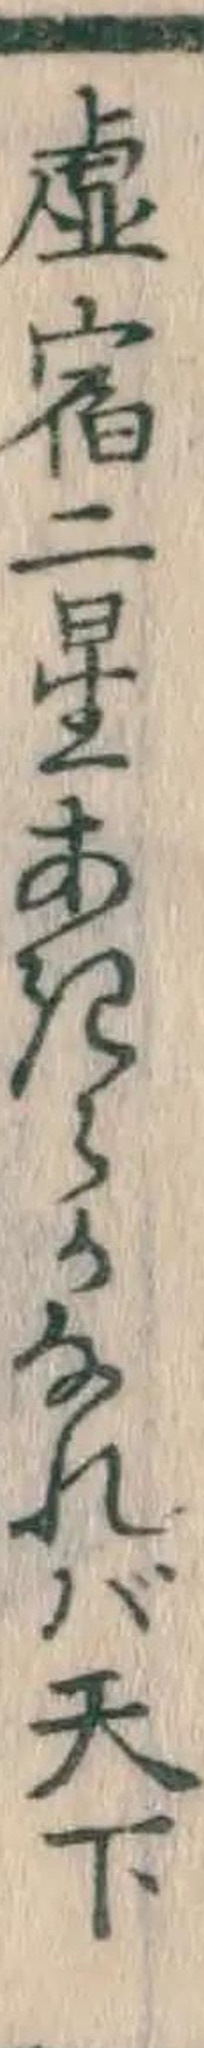虚宿二星あきらかなれば天下
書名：広益秘事大全 3巻. [2]
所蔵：国立国会図書館 National Diet Library, JAPAN
